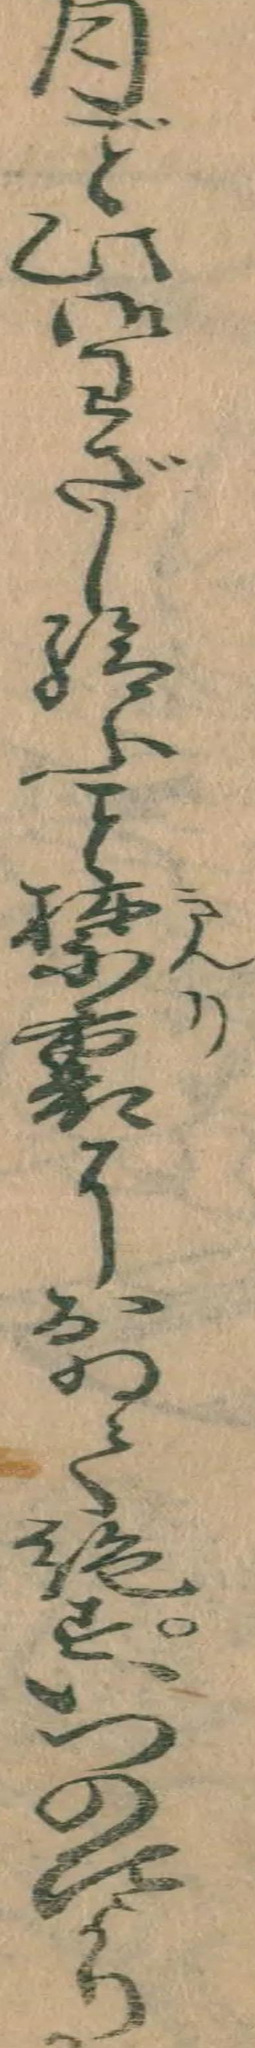月ごと此御わざし給ふこと禁裏におゐて絶す。いつの頃よりか
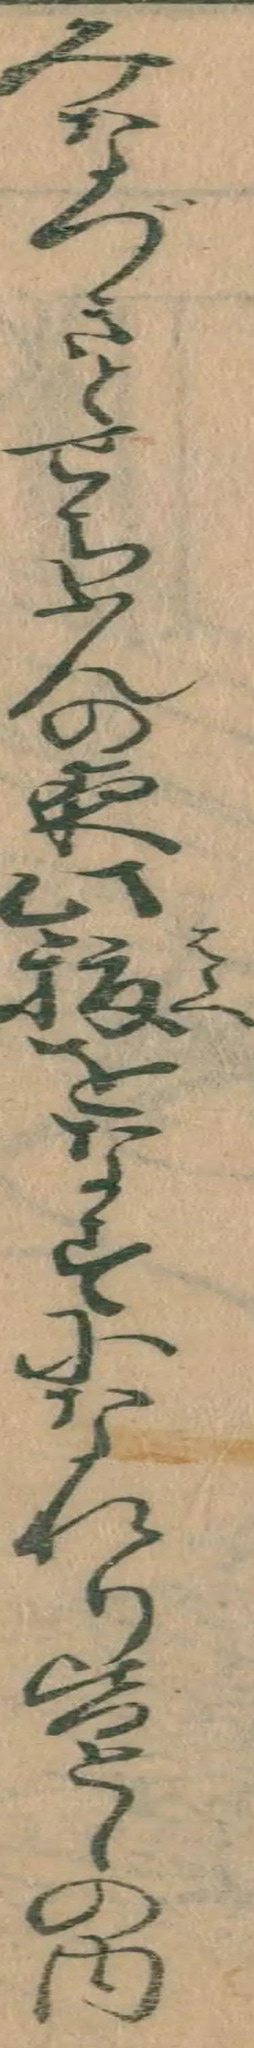みなづきとせちふんの夜此祓をなすになれり皆としの内
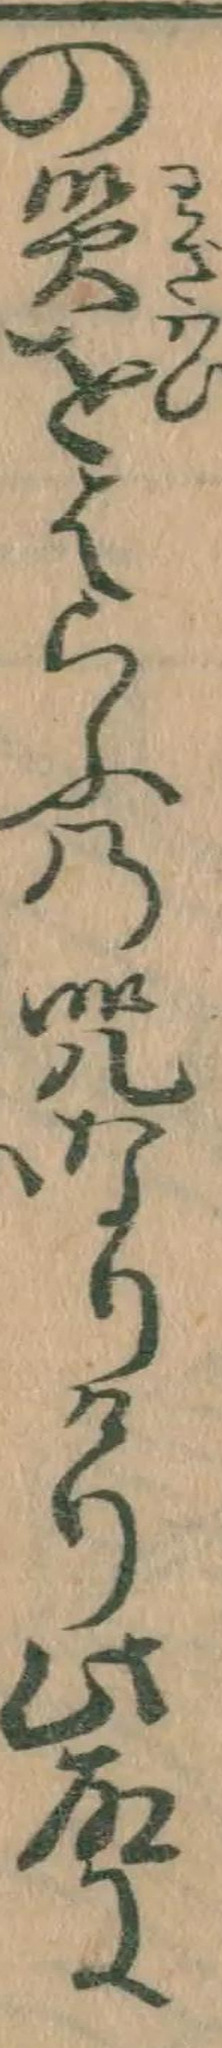の災をはらふの呪なりけり此故に
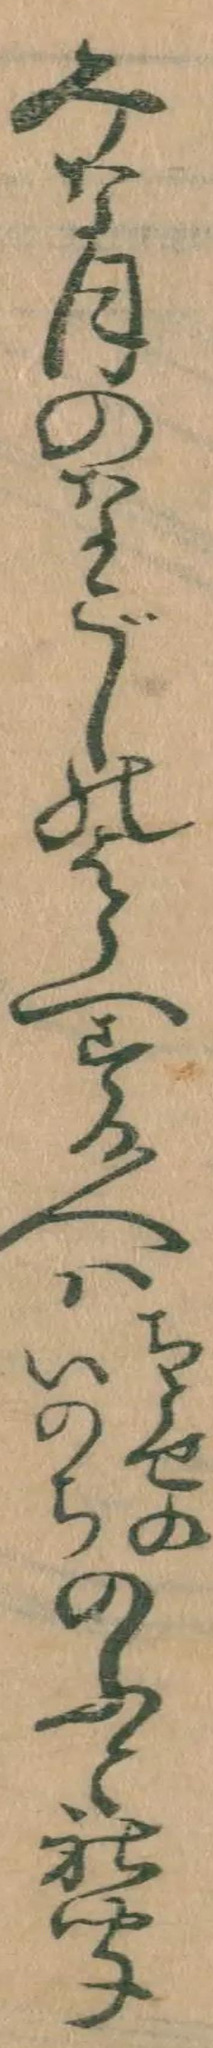みな月のなごしのはらへする人はちとせのいのちのふと社聞
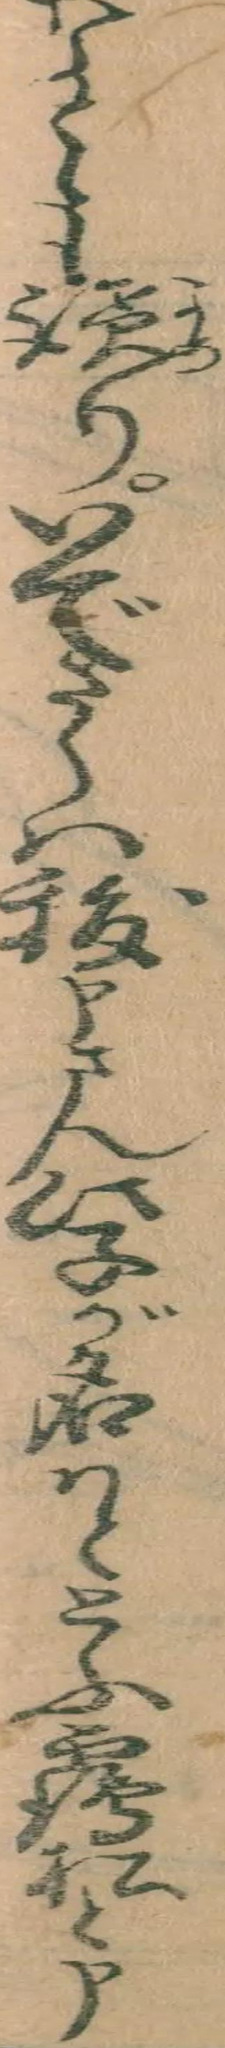なととも読り。いでさらは祓申さん此子が名はととふ鶴松と申
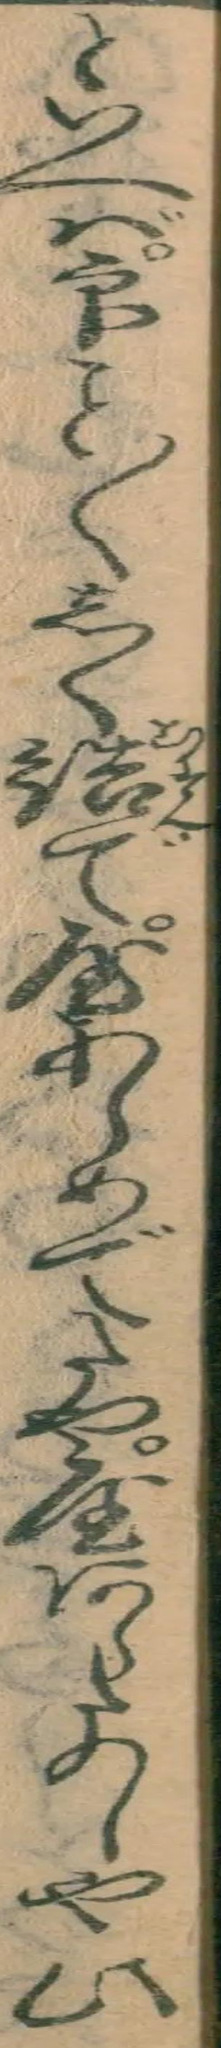といへば。印こと〳〵しく結で。やあらめでたや。やあらたのしや此
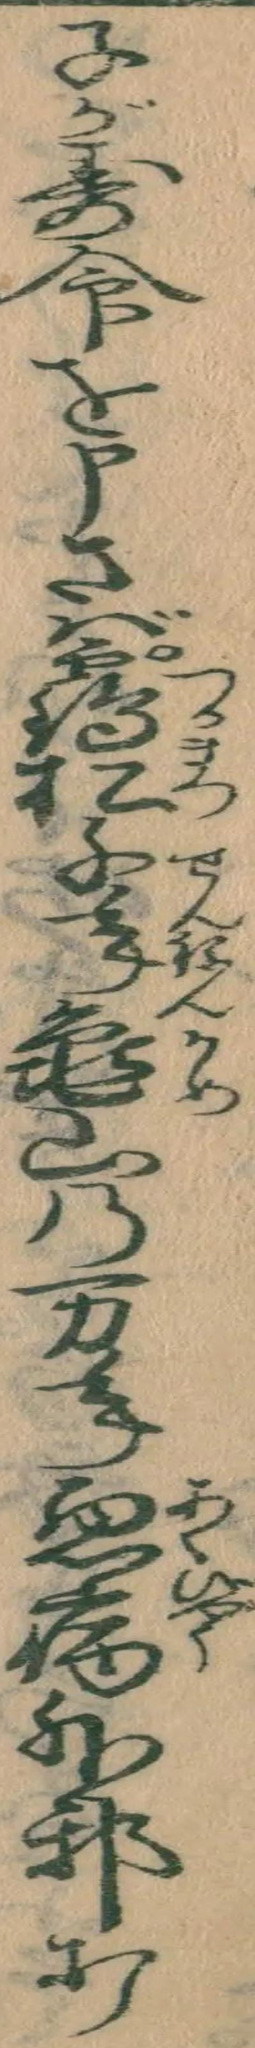子が寿命を申さば。鶴松千年亀山の万年悪病外邪打
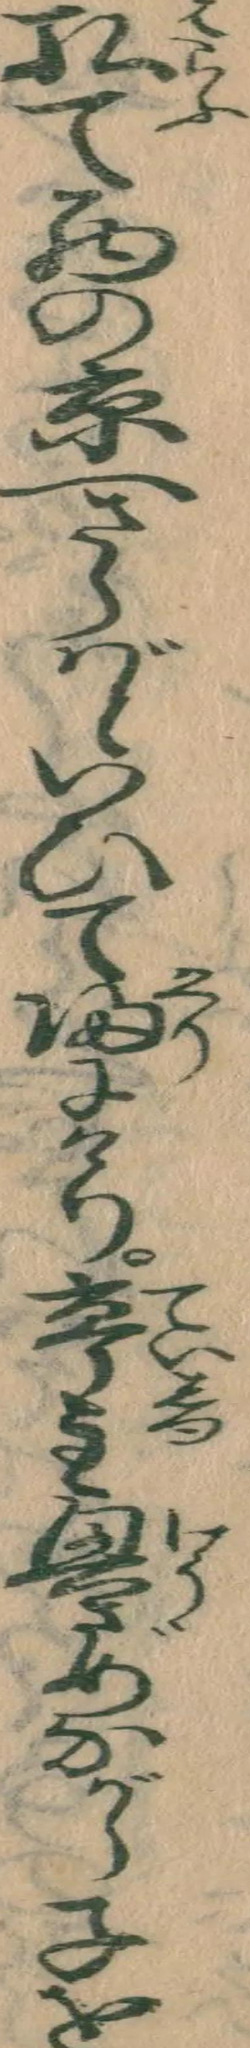払て西の京へさらばといひて帰にけり。亭主興ざめながら子を
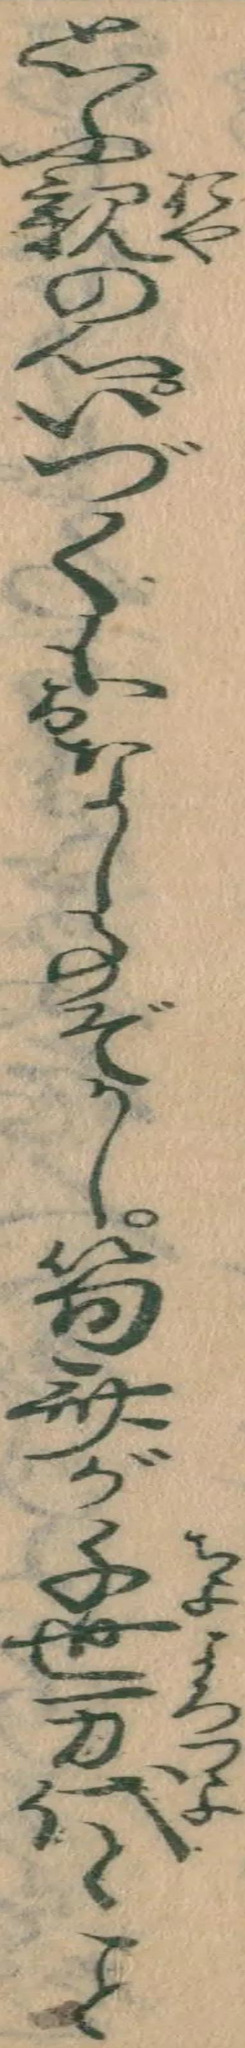思ふ親の心。いづくもおなし事ぞかし。筍斎が千世万代とこと
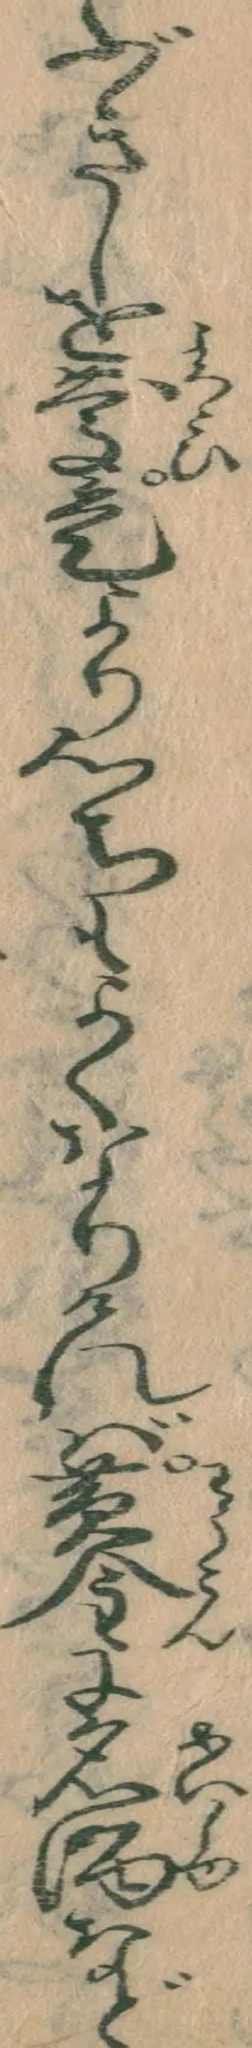ぶきしを慶。是より心ちもよくなりければ。黄金に名酒など
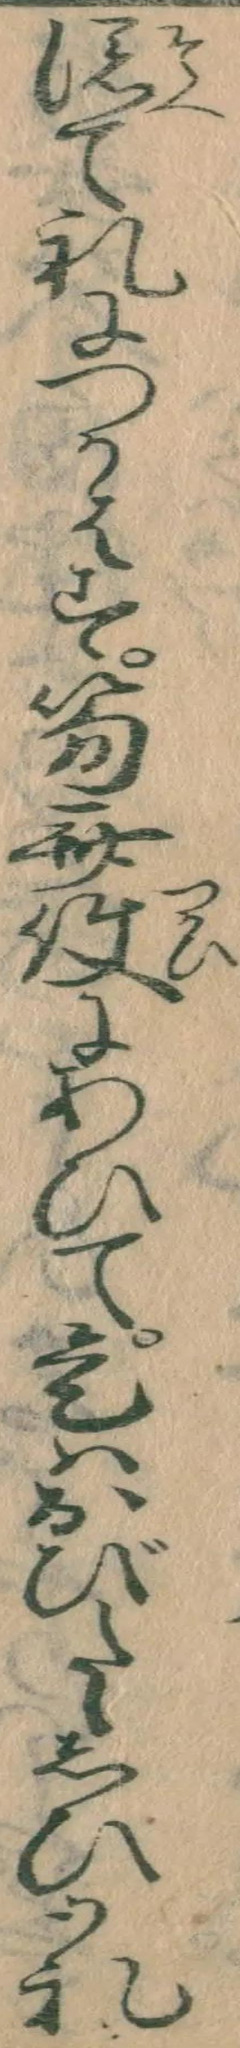添て礼につかはす。筍斎使にあひて。是はおびたゝしひ御礼
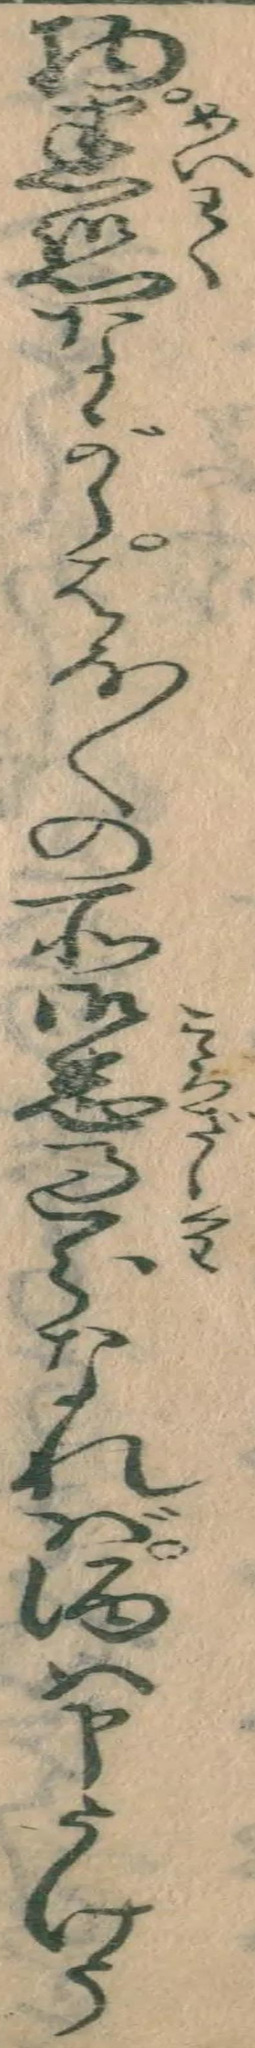物。迷惑ながら。はる〳〵の所御志過分なれば。酒は申うけう
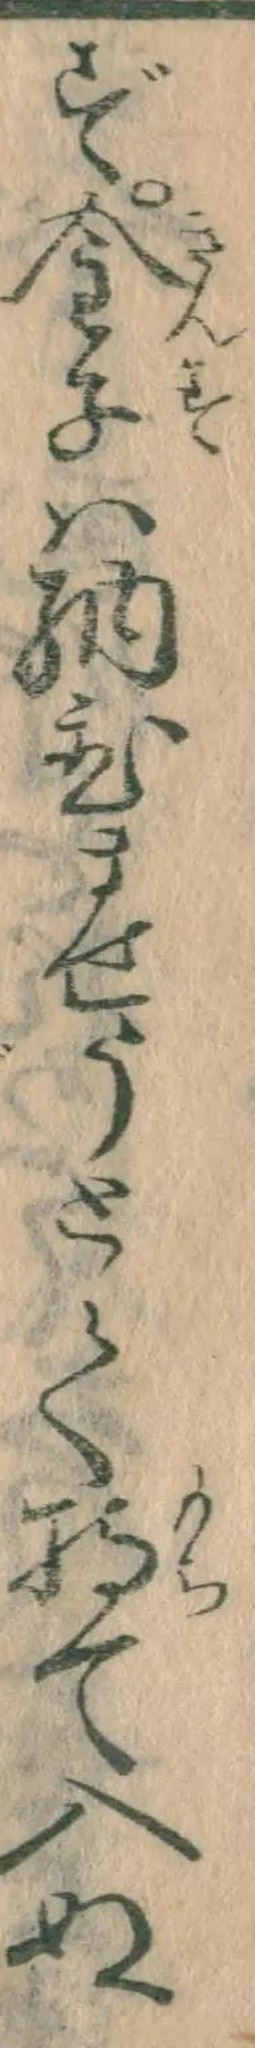ず。金子は納置ませうとて持て入ぬ
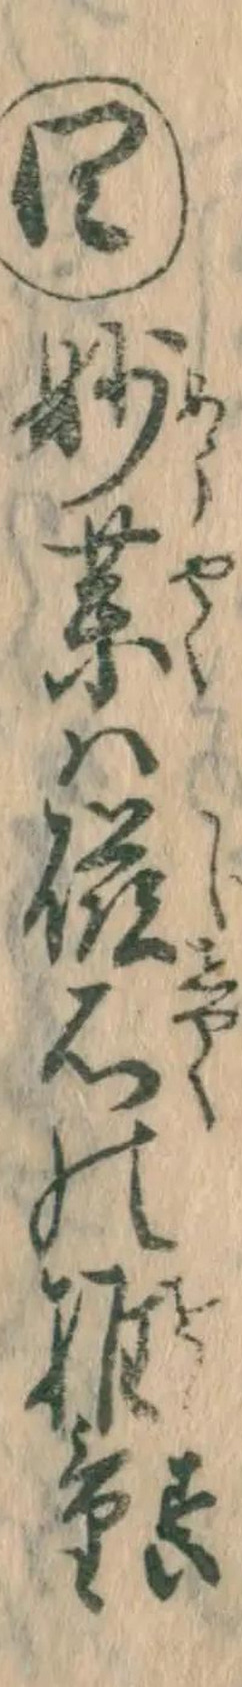四妙薬は磁石の推量
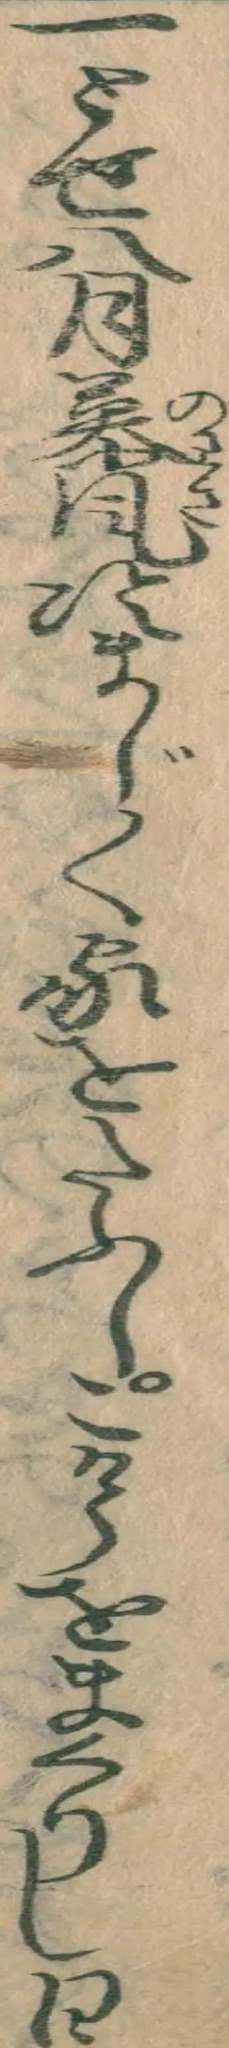一とせ八月暴風凄まじく家をたふし。こけらうをまくりし日
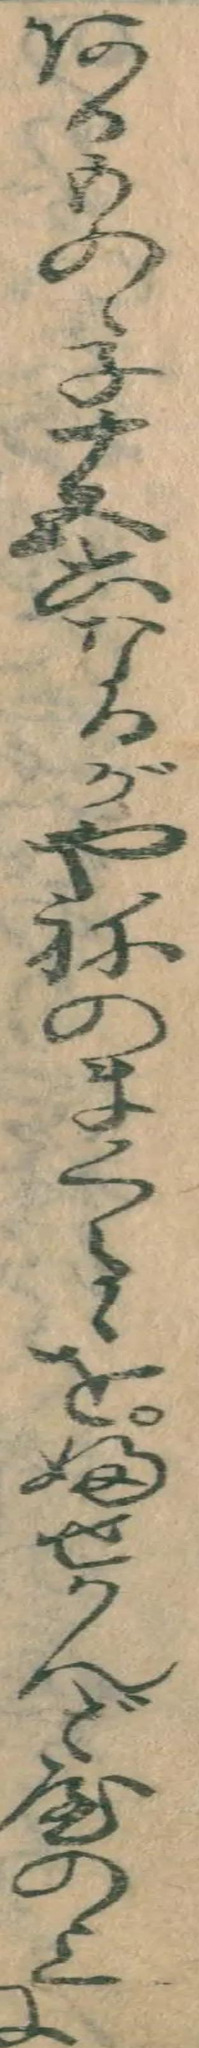あるものゝ子十五六なるがやねのまくるゝを。ふせかんど屋の上に
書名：新竹斎 5巻
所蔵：国立国会図書館 National Diet Library, JAPAN
